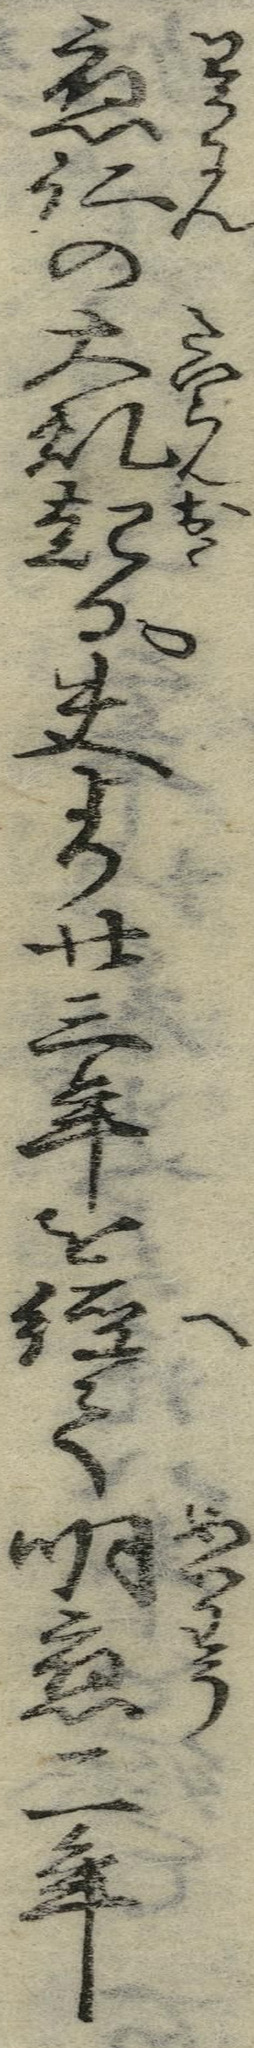応仁の大乱起る。夫より廿三年を経て明応二年
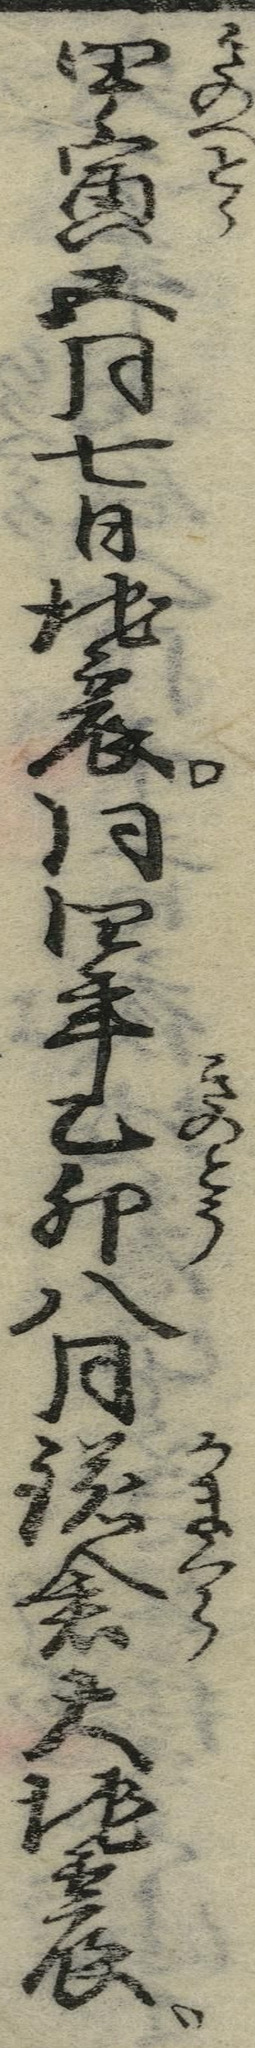甲寅五月七日地震。同四年乙卯八月鎌倉大地震。
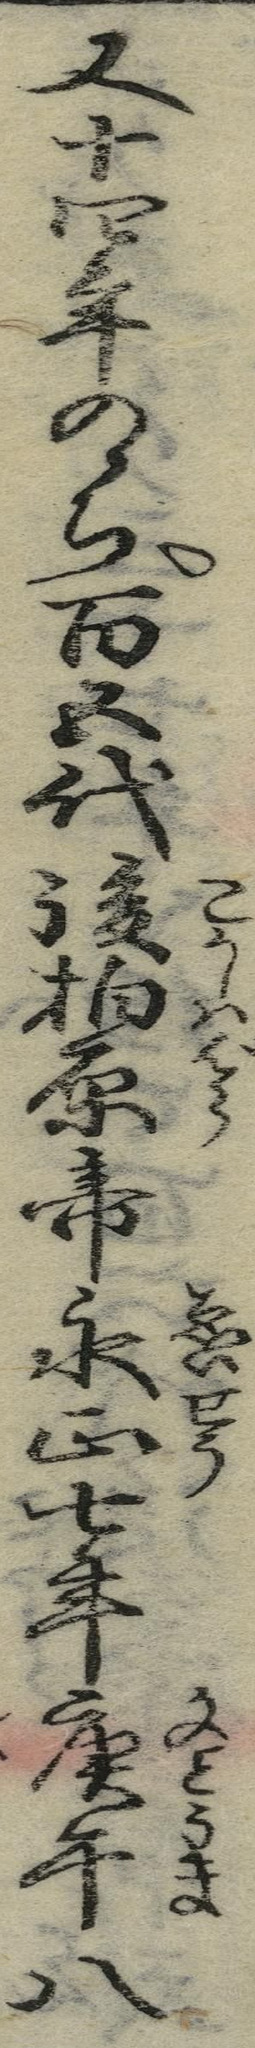又十四年のゝち。百五代後柏原帝永正七年庚午八
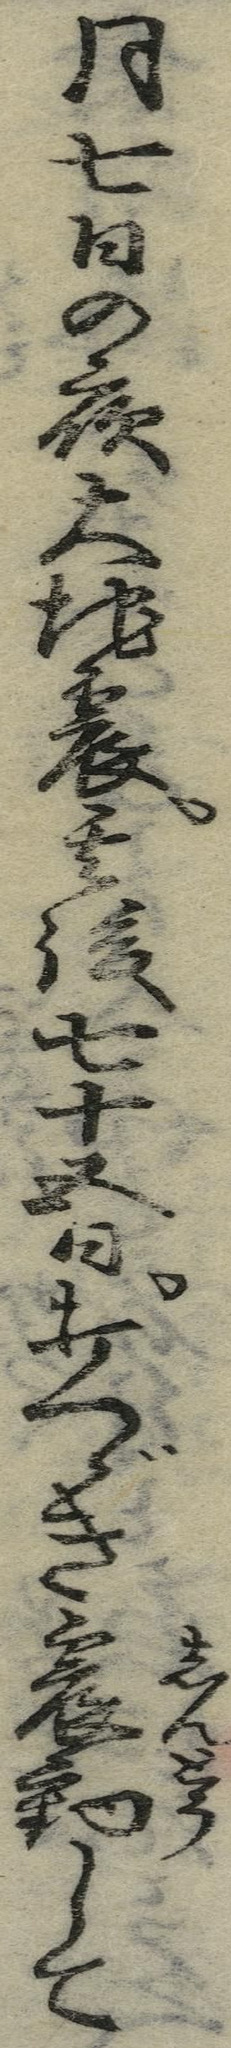月七日の夜大地震。其後七十五日。打つゞき震動して
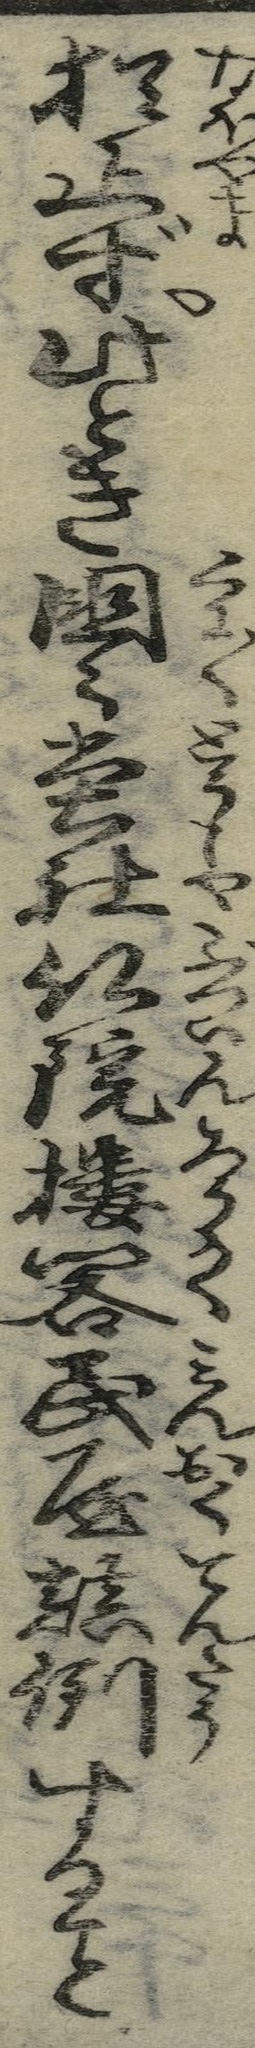猶止ず。此とき国〻堂社仏院楼閣民屋顛倒すること
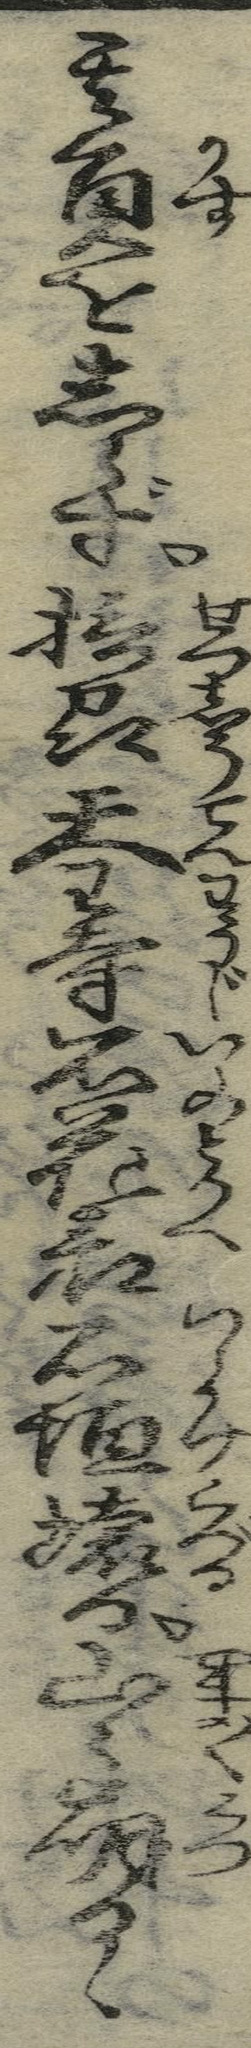其員をしらず。摂州天王寺石花表石垣壊る。山〻崩るゝ

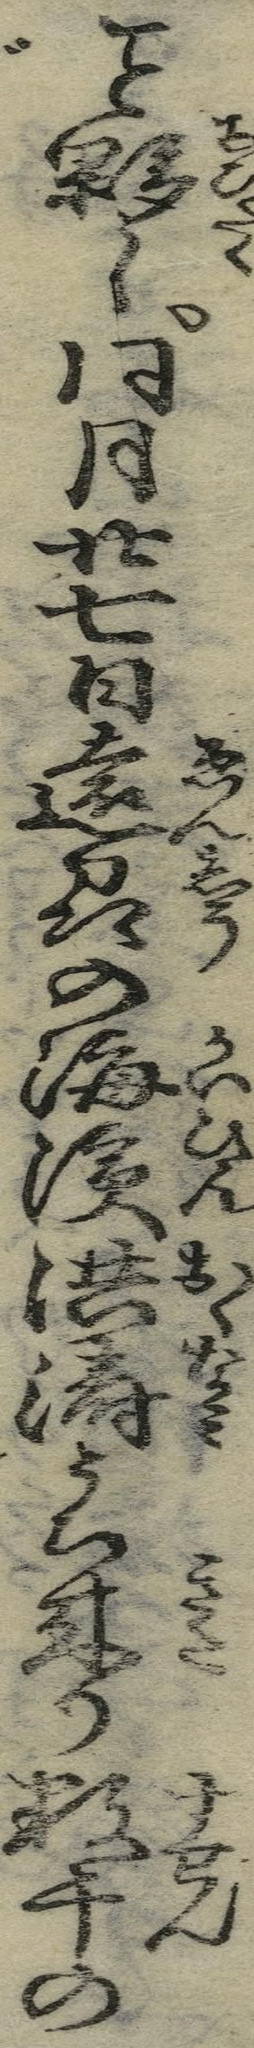こと夥し。四月廿七日遠州の海浜洪濤うち来り数千の
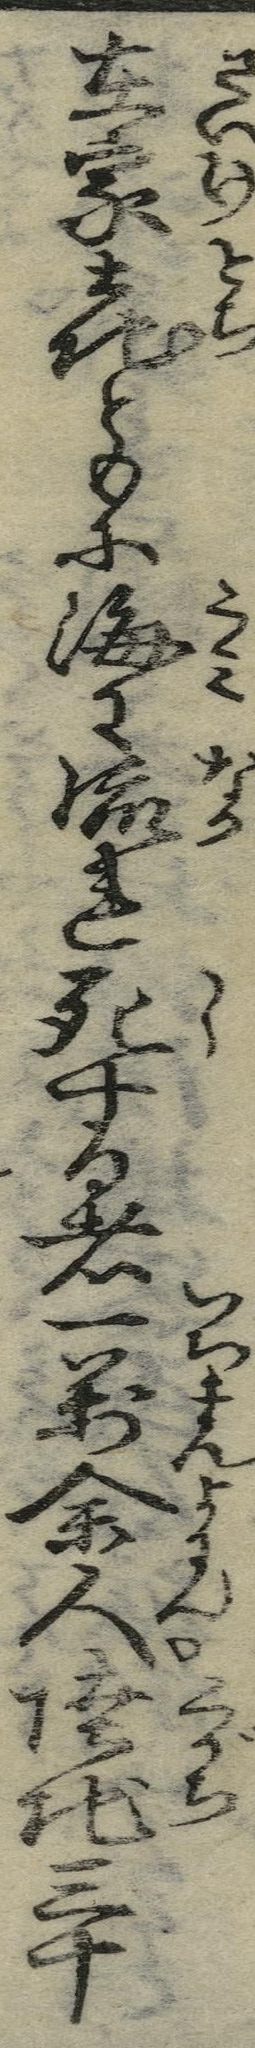在家土地ともに海に流れ死する者一万余人。陸地三十
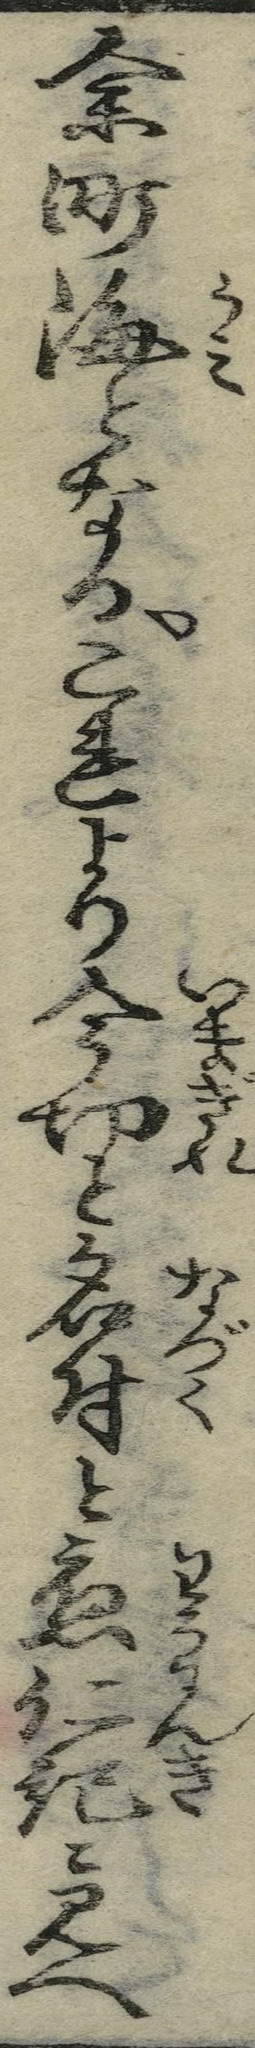余町海となる。これより今切と名付と応仁記に見へ
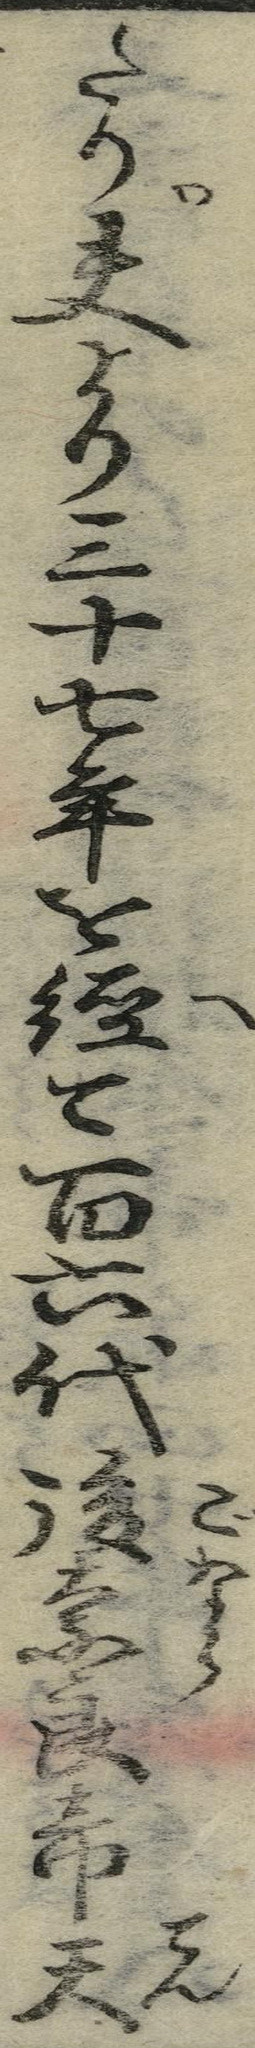たり。夫より三十七年を経て百六代後奈良帝天
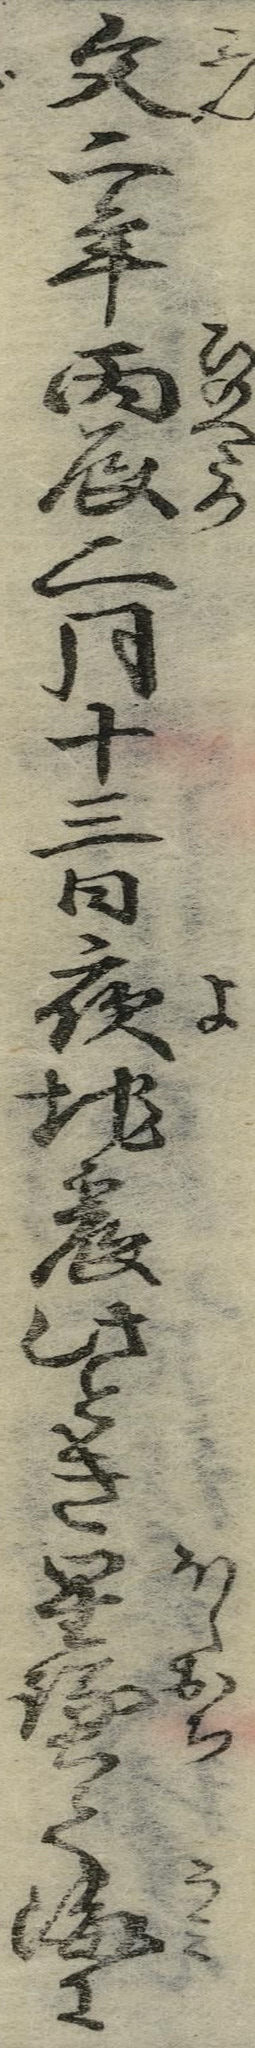文二年丙辰二月十三日夜地震此とき星墜て海に
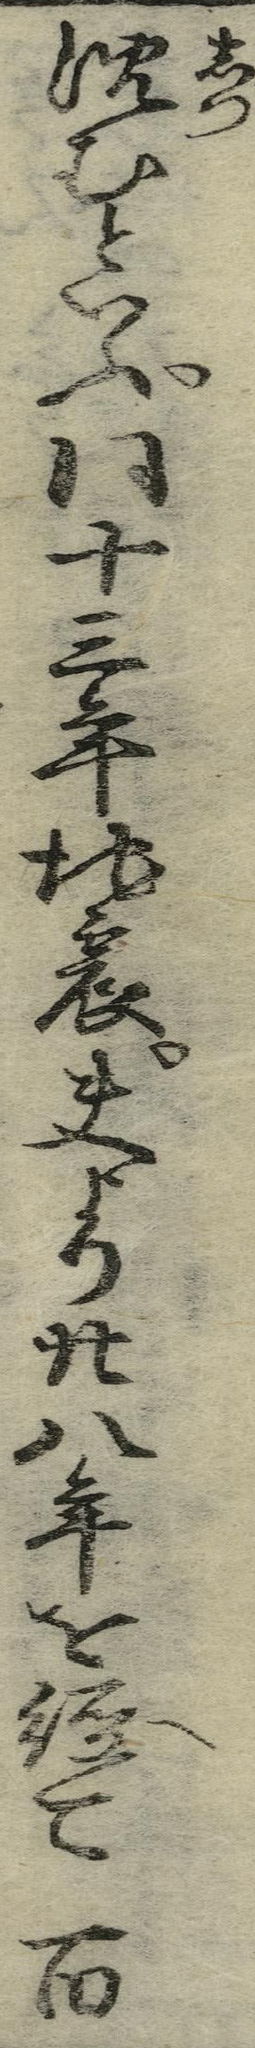沈むといふ。同十三年地震。夫より廿八年を経て百
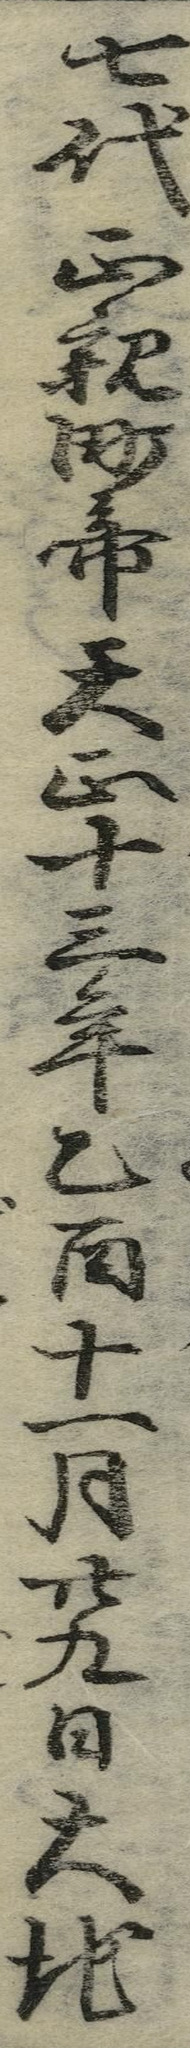七代正親町帝天正十三年乙酉十一月廿九日大地
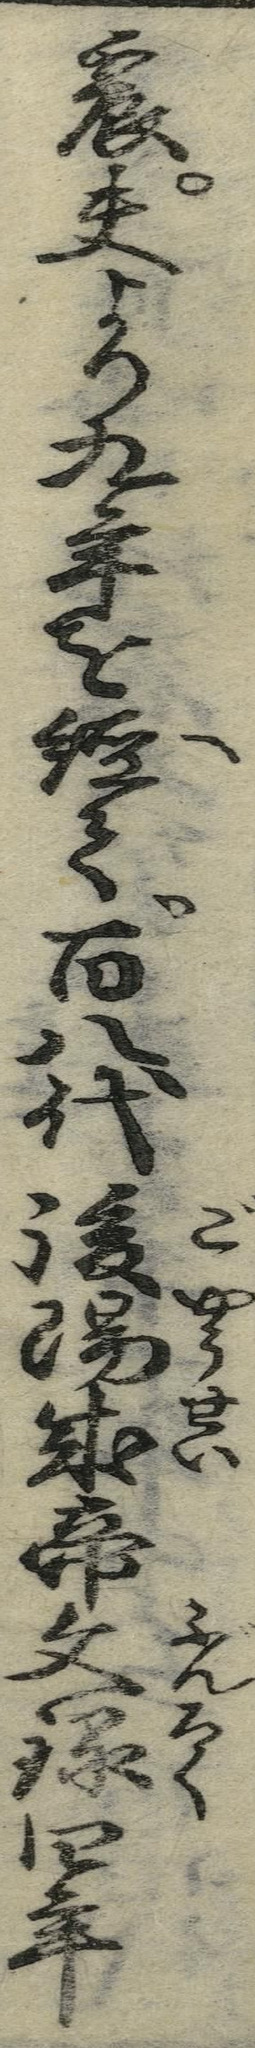震。夫より九年を経て。百八代後陽成帝文禄四年
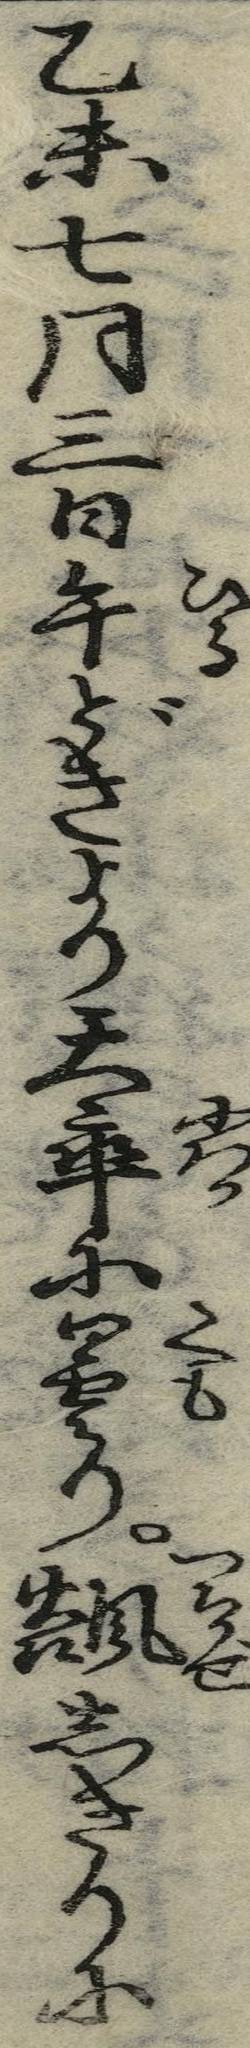乙未七月三日午どきより天卒に曇り。飆しきりに
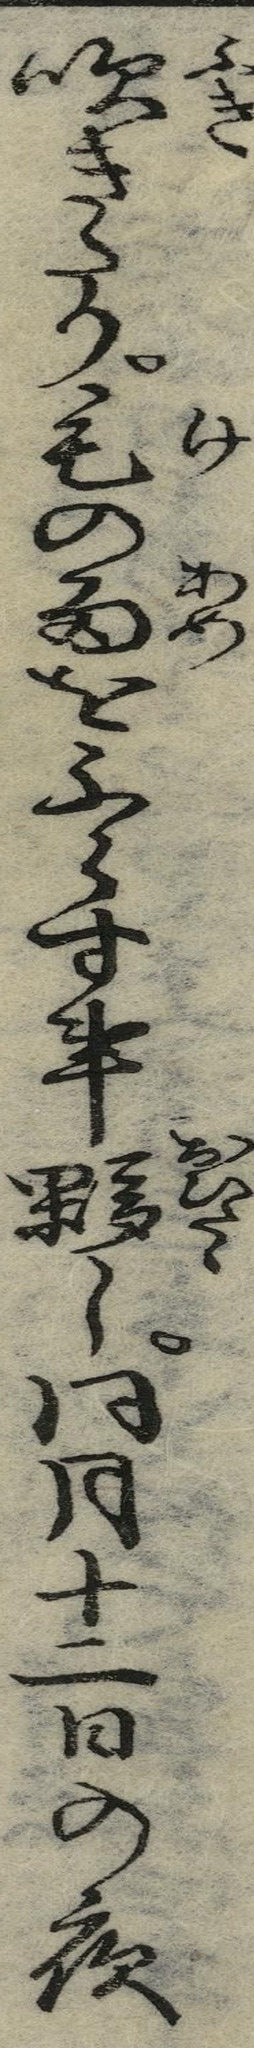吹きたり。毛の雨をふらす事夥し。同月十二日の夜
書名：本朝地震記　全
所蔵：東京大学地震研究所図書室 Earthquake Research Institute Library, The University of Tokyo, JAPAN
